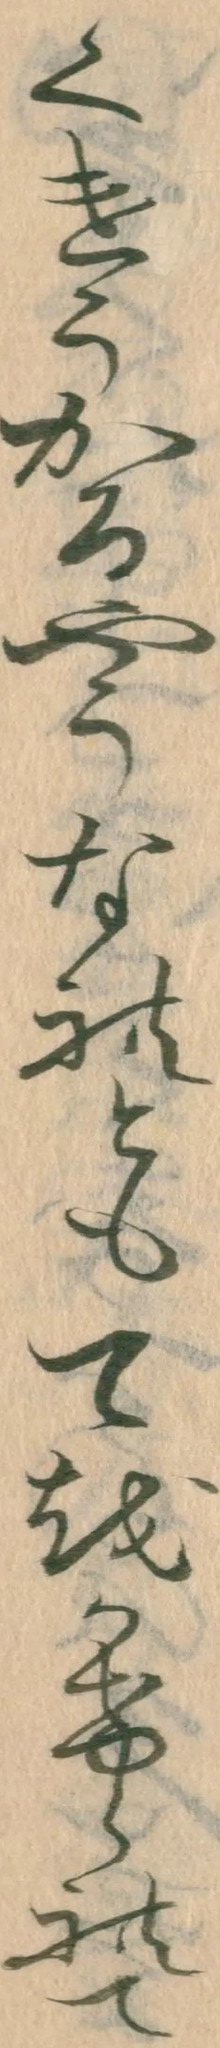くけうかるやうなれともてをかけられて
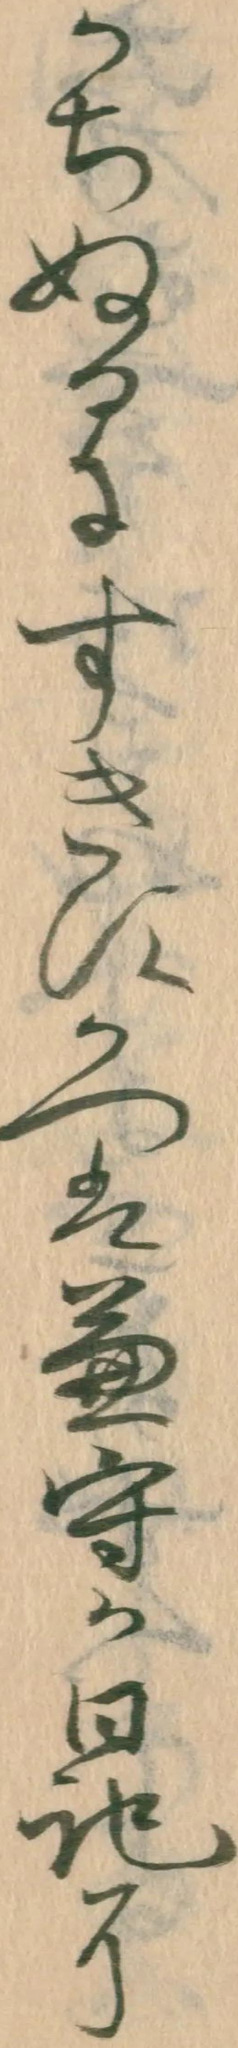かちぬるにすきすかつは兼守か日記に
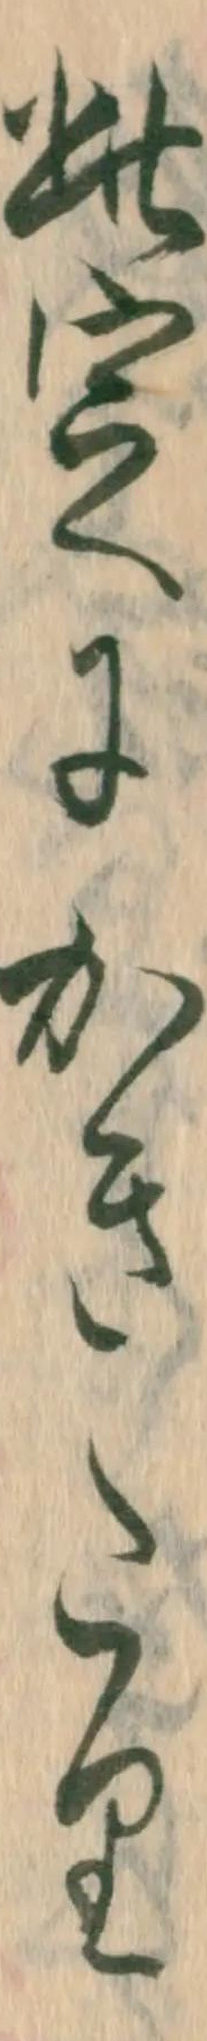此定にかきたり
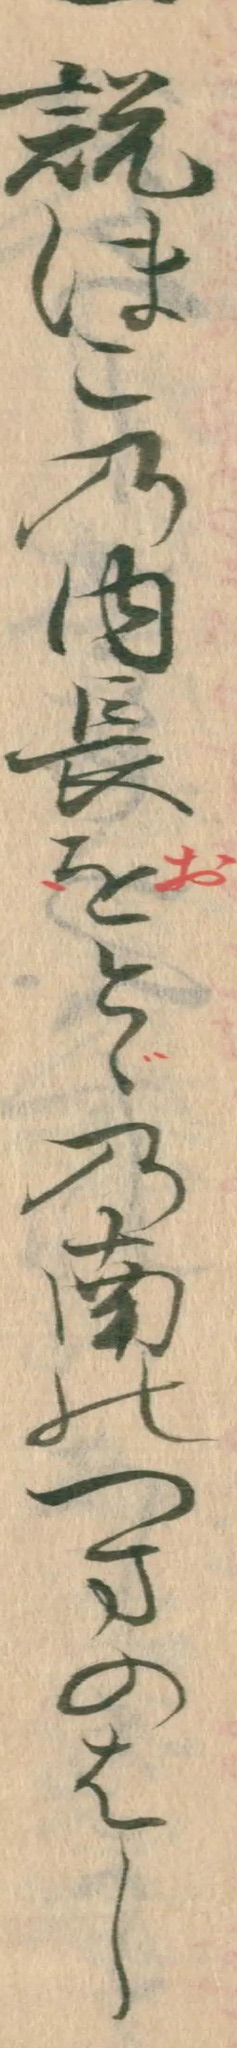一説ほこの内長をとゞの南のつまのはし
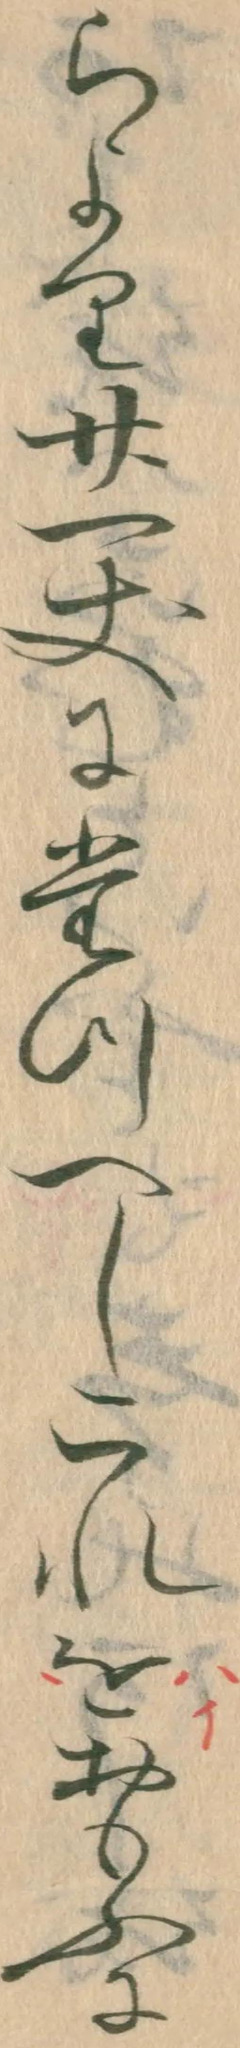らより廿一丈にたつへしこれをおもふに
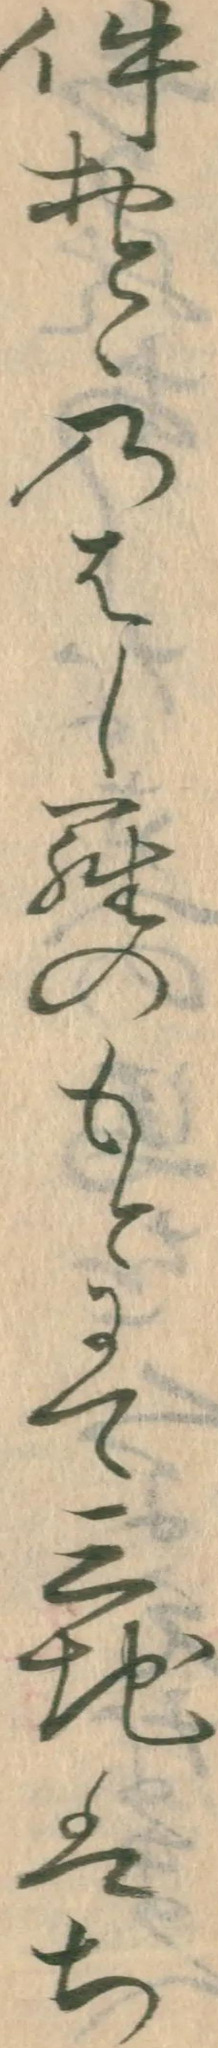件おとゝのはしらのもとにて三地はち
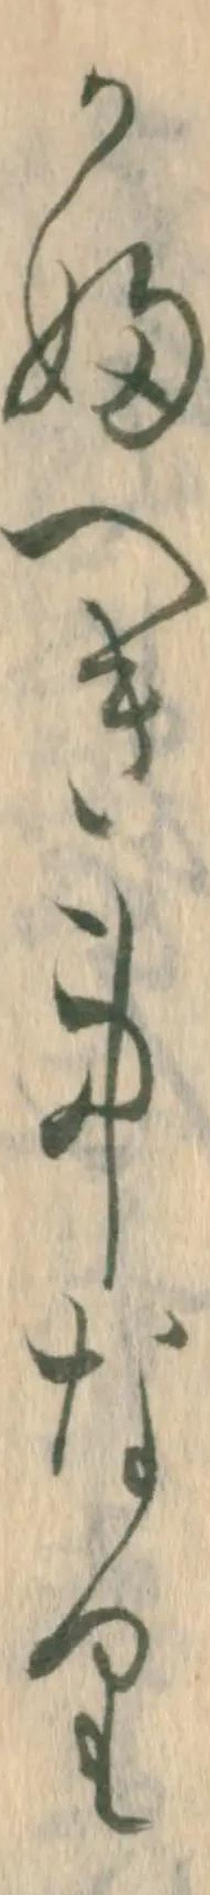かふへき事なり
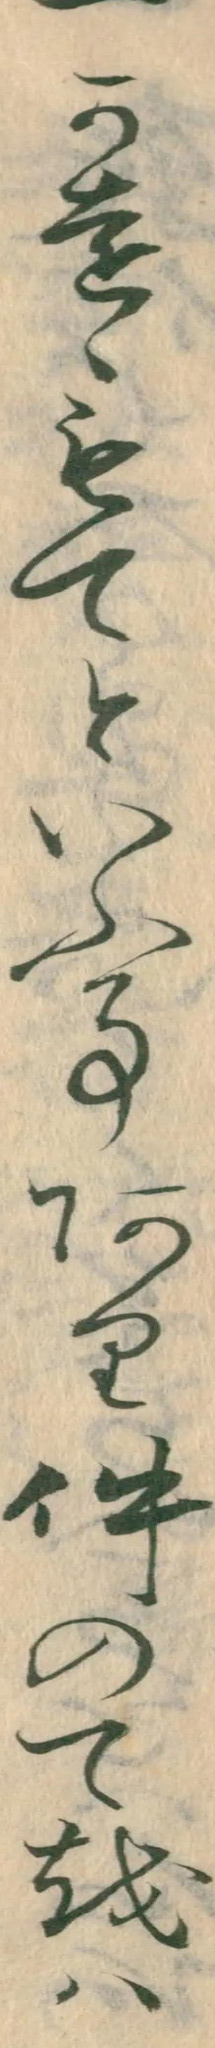一かをゝもてといふ事あり件のてをは
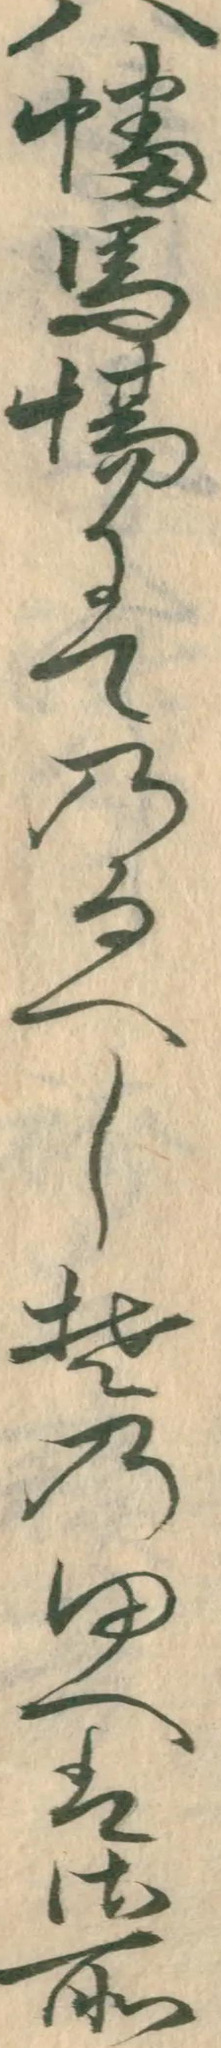八幡馬場にてのるへしそのゆへは御所
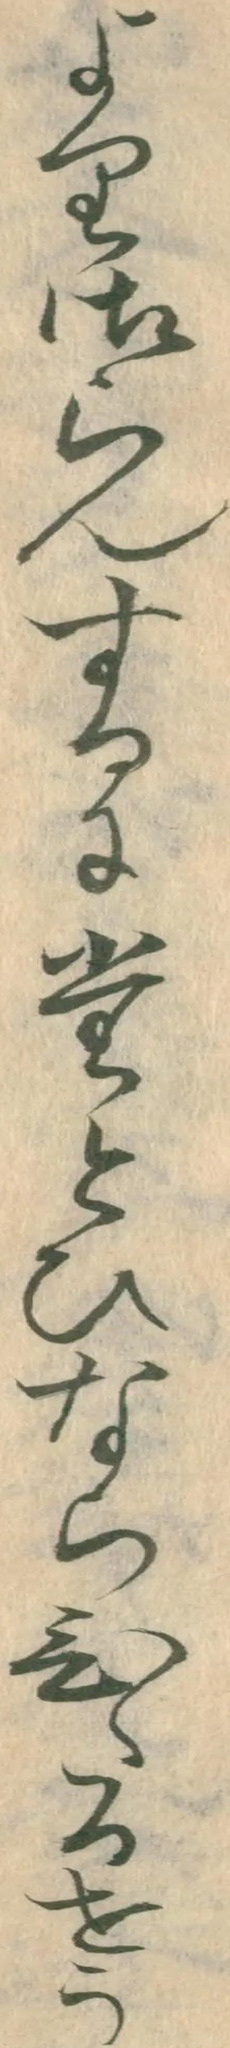より御らんするにたとひならひたるせう
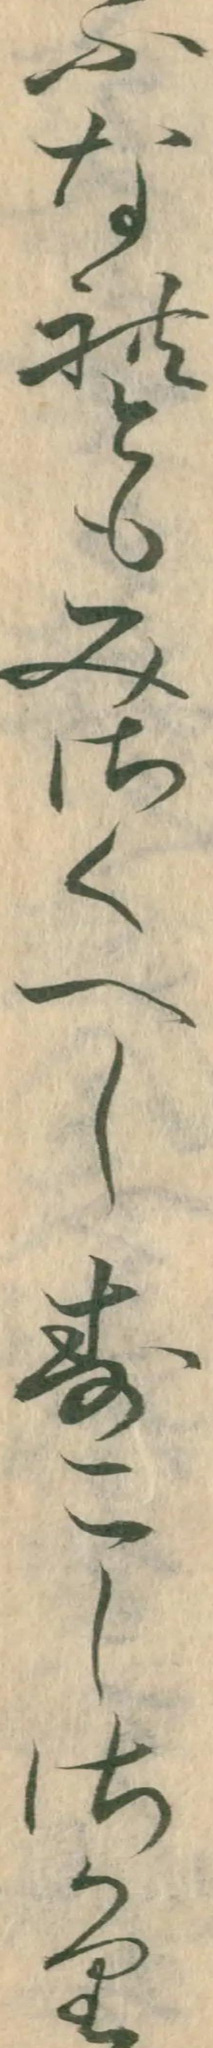ふなれともみさくへしすこしさかり

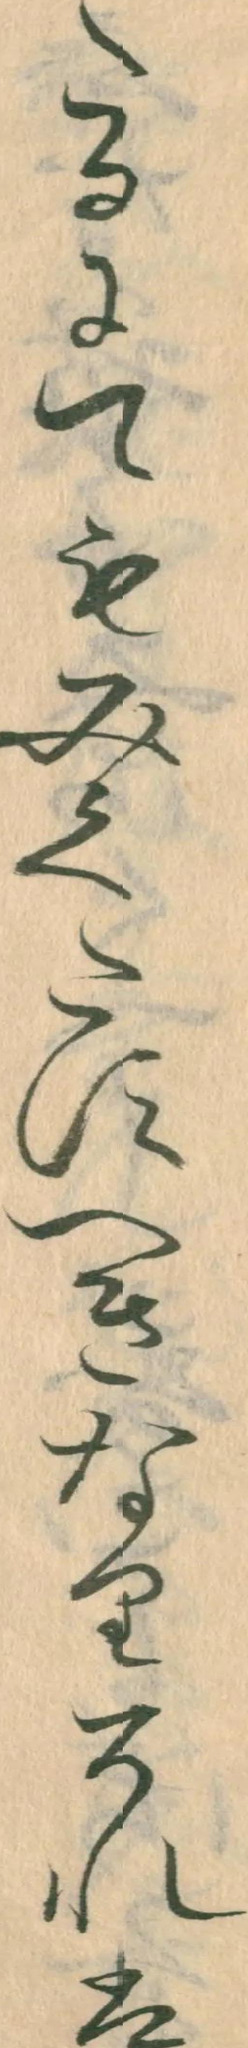たるにてもみくたすへきなりそれは
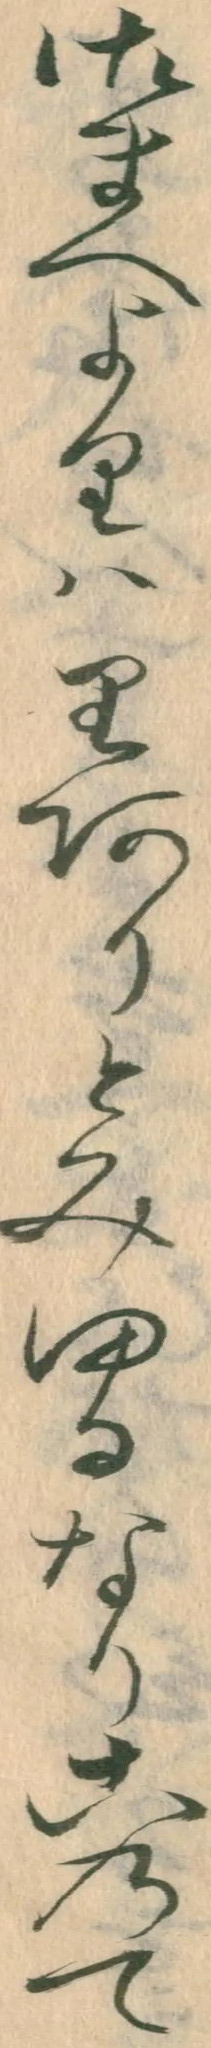御まへよりはりありとみゆるなりこのて
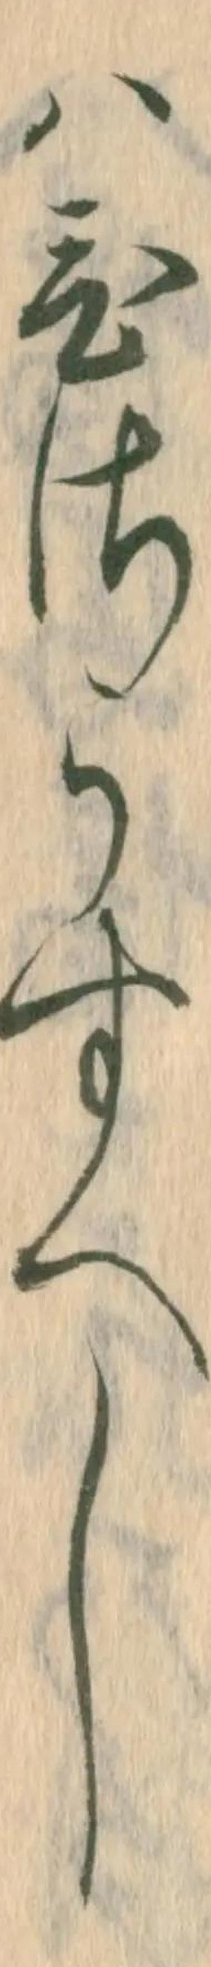はひさうすへし
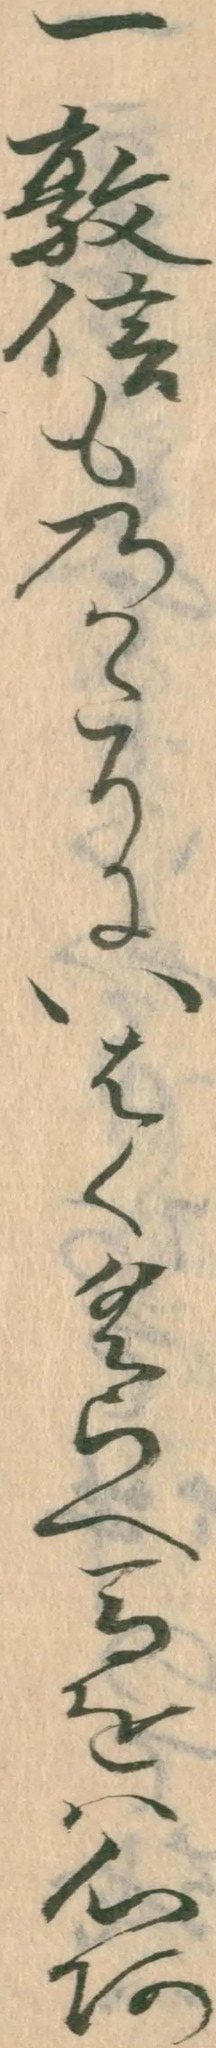一敦信ものかたりにいはくくらへ馬をは心あ
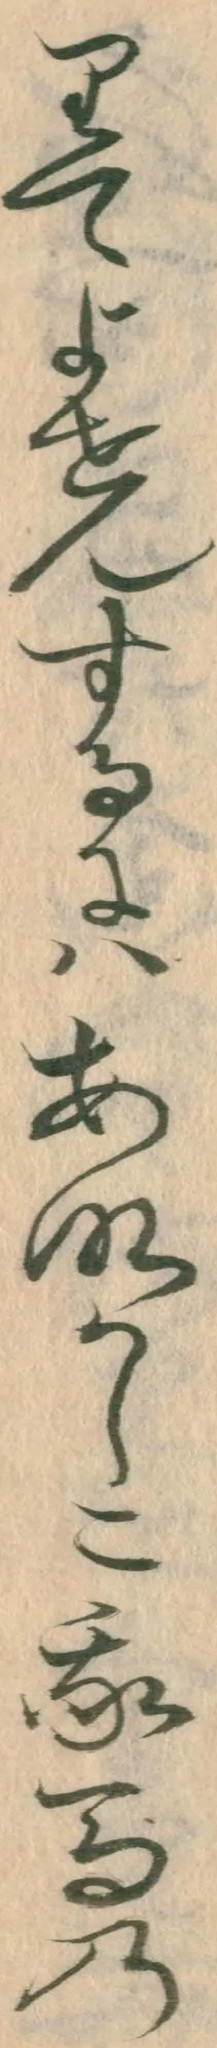りてよせんするにはあなかしこ我馬の
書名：賀茂社記録. 第13冊
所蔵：国立国会図書館 National Diet Library, JAPAN
